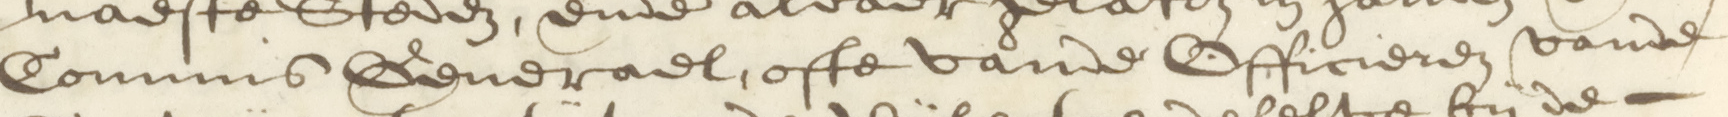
Commis Generael, ofte vande Officieren vande
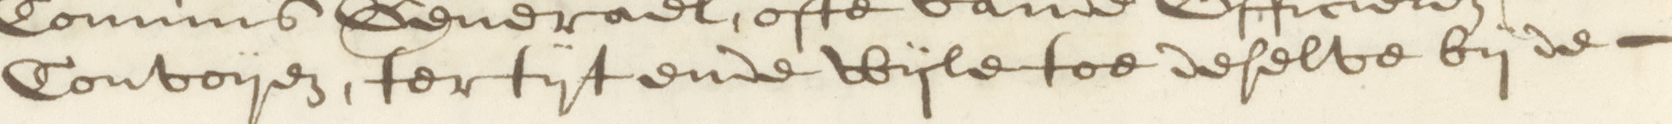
Convoijen, ter tijt ende wijle toe deselve bij de
